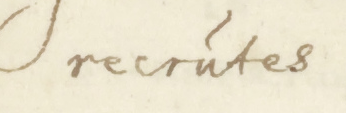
recrutes
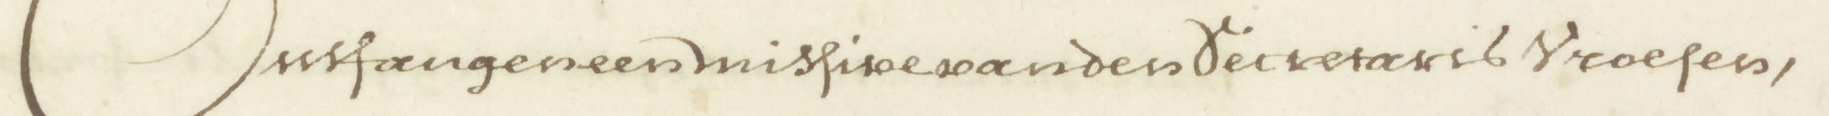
Ontfangen een missive vanden Secretaris Vroesen,
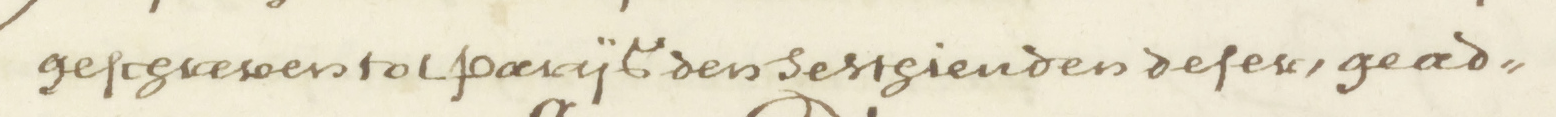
geschreven tot Parijs den sesthienden deser, gead„
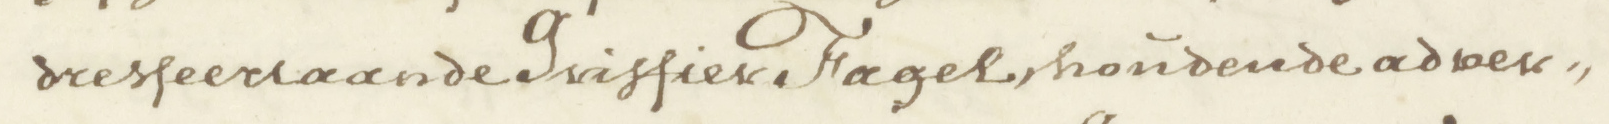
dresseert aande Griffier Fagel, houdende adver„,
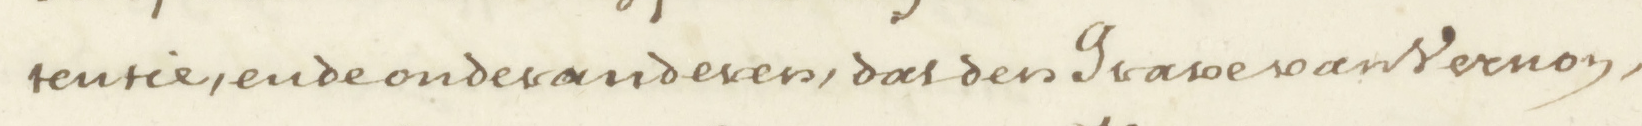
tentie, ende onder anderen, dat den Grave van Vernon,
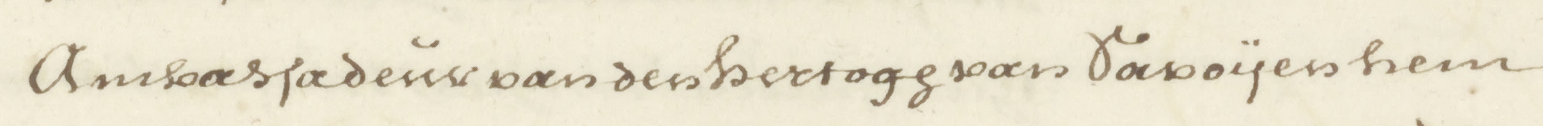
Ambassadeur van den Hertogh van Savoijen hem
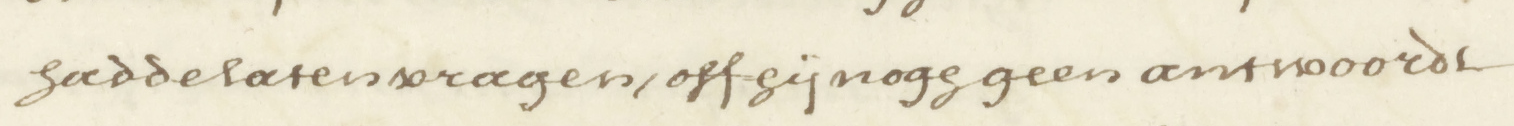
hadde laten vragen, off hij nogh geen antwoordt
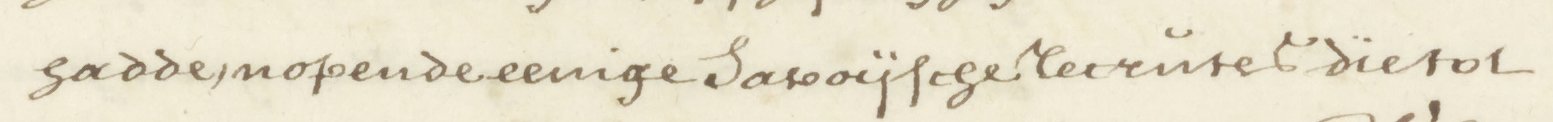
hadde, nopende eenige Savoijsche recrutes die tot
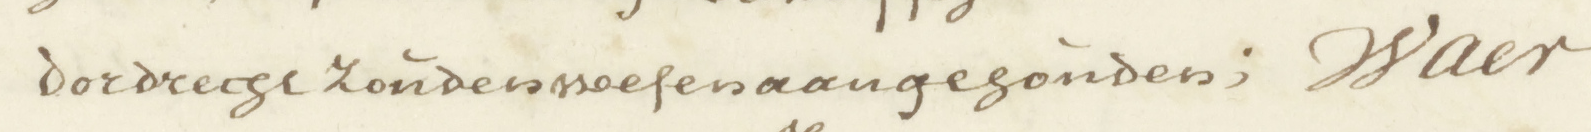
Dordrecht zouden wesen aangehouden: Waer
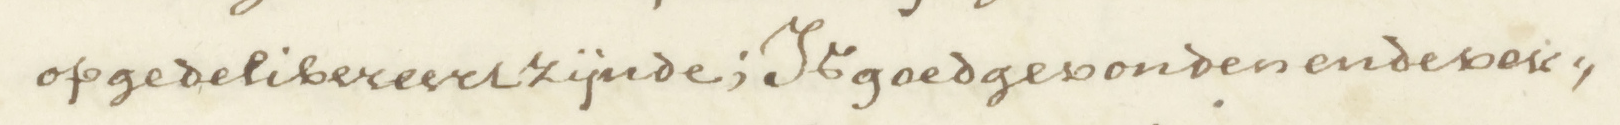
op gedelibereert zijnde; is goedgevonden ende ver„
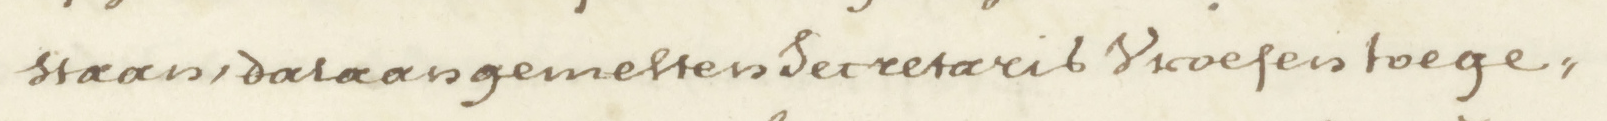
staan, dat aan gemelten secretaris Vroesen toege„
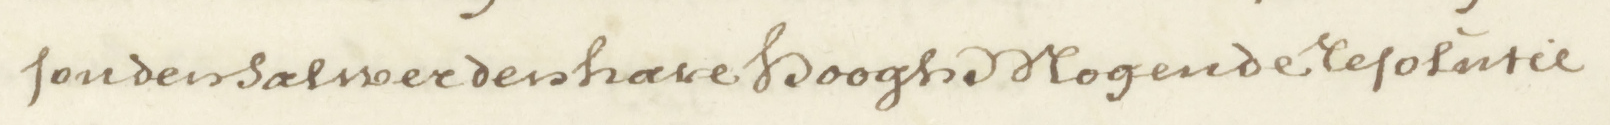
sonden sal werden hare Hoogh Mogende resolutie
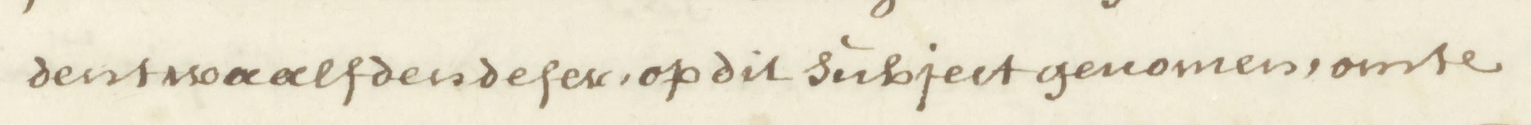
den twaalfden deser, op dit subject genomen, om te
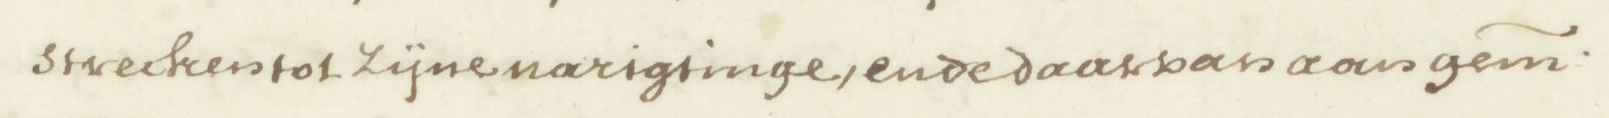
strecken tot zijne narigtinge, ende daarvan aan gem.
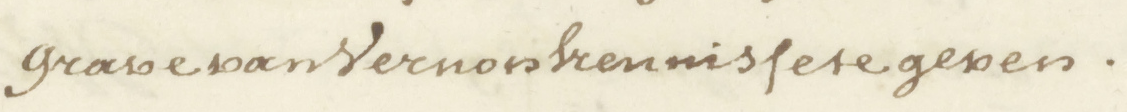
grave van Vernon kennisse te geven.
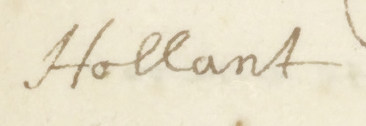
Hollant
